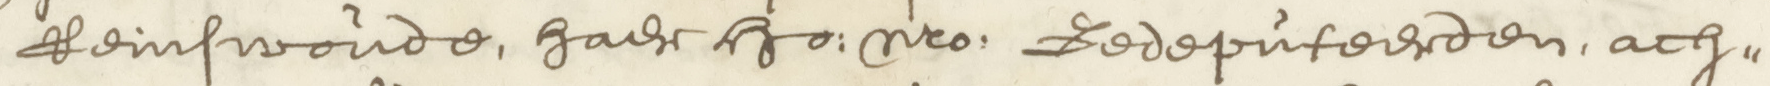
Reinswoude, haer Ho:Mo: Gedeputeerden, ach„
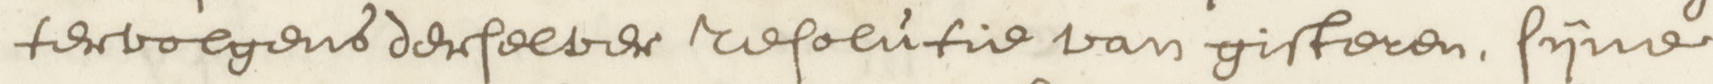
tervolgens derselver resolutie van gisteren, sijne
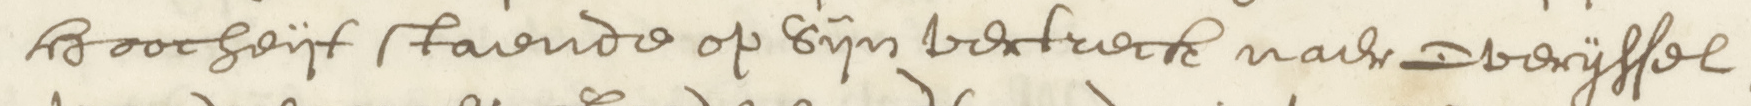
Hoocheijt staende op Sijn vertreck naer Overijssel,
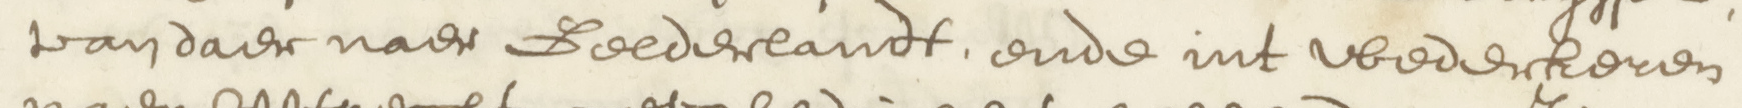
van daer naer Gelderlandt, ende int wederkeren
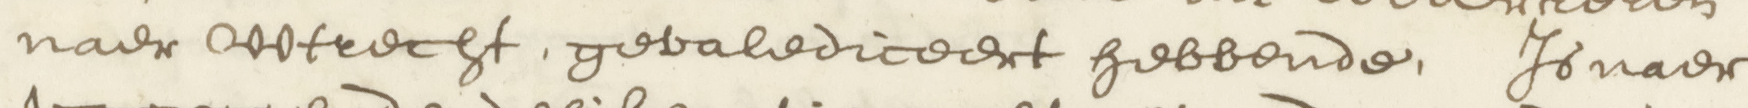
naer UUtrecht, gevalediceert hebbende, Is naer
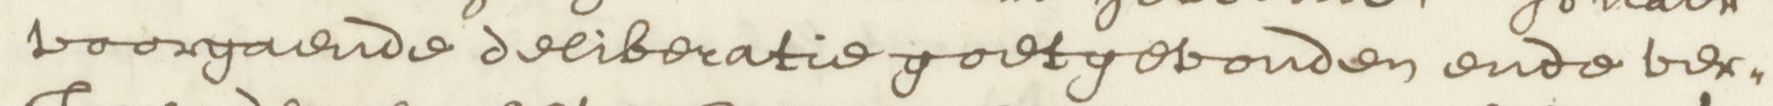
voorgaende deliberatie goetgevonden ende ver,,
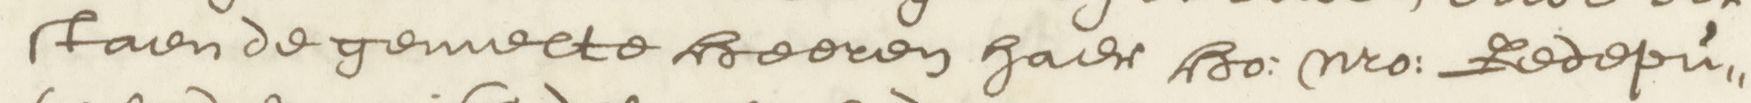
staen de gemelte heeren haer Ho:Mo: Gedepu„
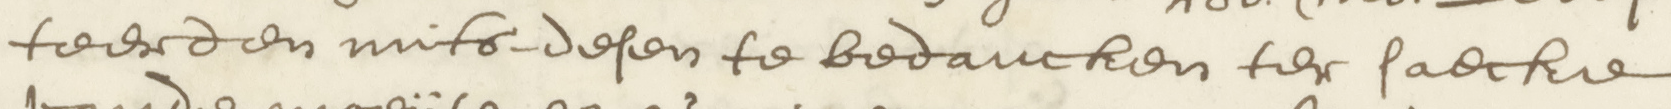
teerden mits desen te bedancken ter saecke
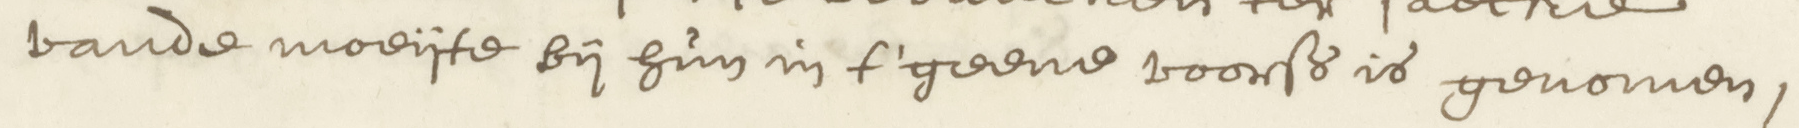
vande moeijte bij hun in t'geene voors is genomen,
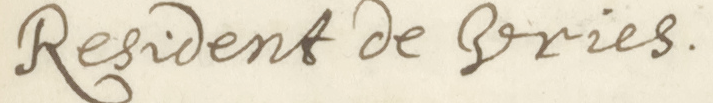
Resident de Vries.
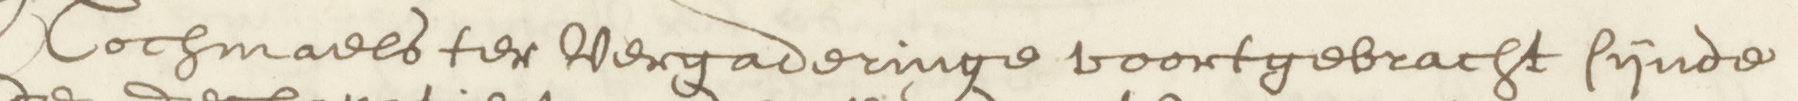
Nochmaels ter Vergaderinge voortgebracht sijnde
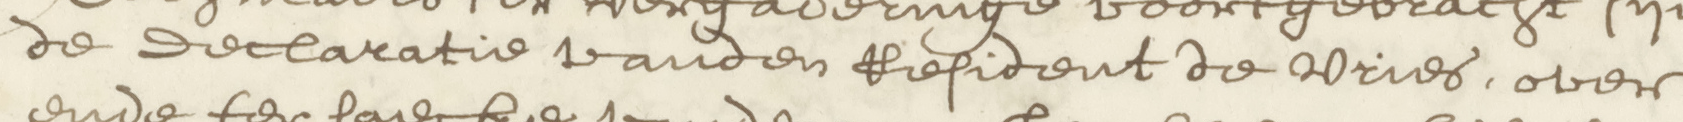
de declaratie vanden Resident de Vries, over
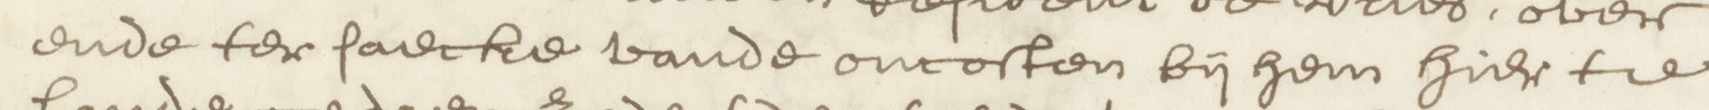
ende ter saecke vande oncosten bij hem hier te
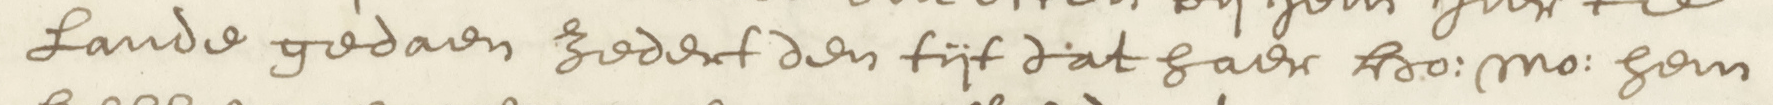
Lande gedaen zedert den tijt dat haer Ho:Mo: hem
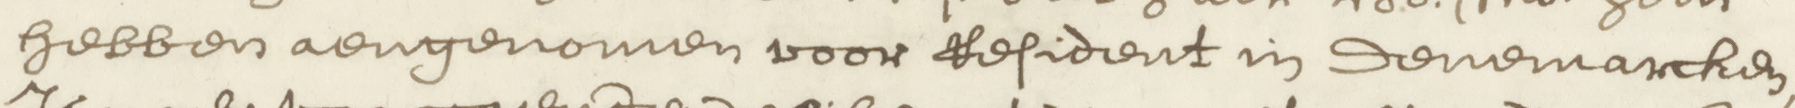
hebben aengenomen voor Resident in Denemarcken
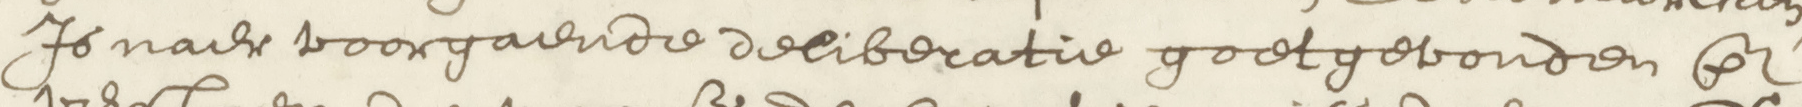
Is naer voorgaende deliberatie goetgevonden &
